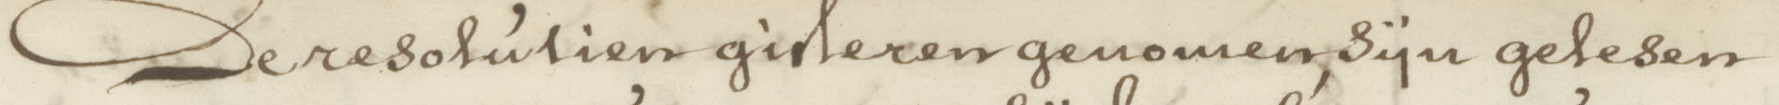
De resolutien gisteren genomen, sijn gelesen
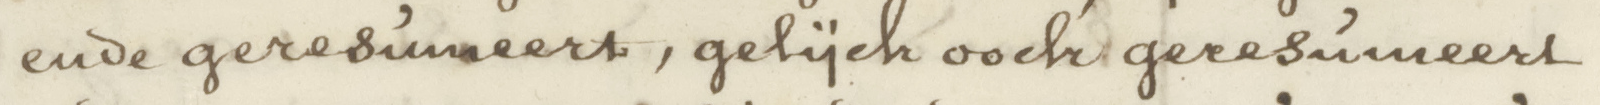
ende geresumeert, gelijck oock geresumeert
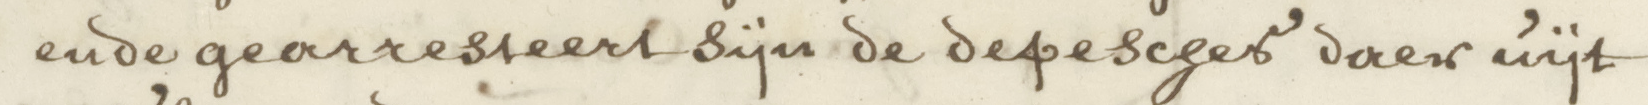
ende gearresteert sijn de depesches daer uijt
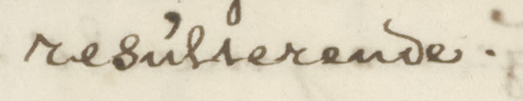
resulterende.
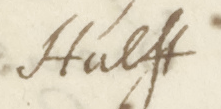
Hulft
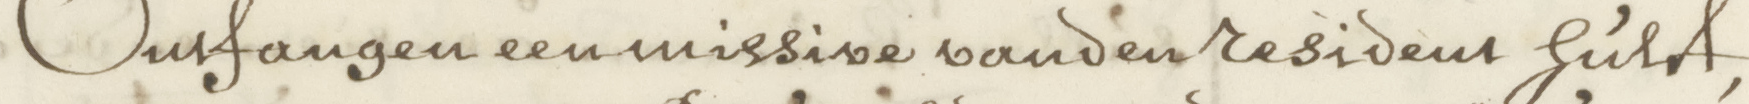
Ontfangen een missive vanden resident Hult,
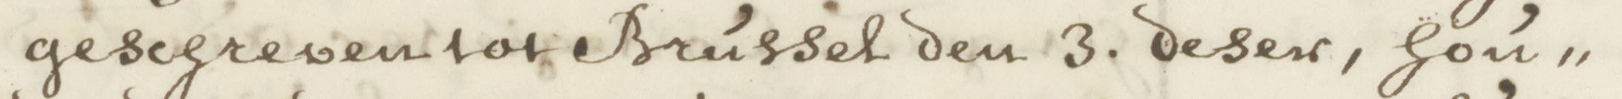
geschreven tot Brussel den 3. deser, hou„
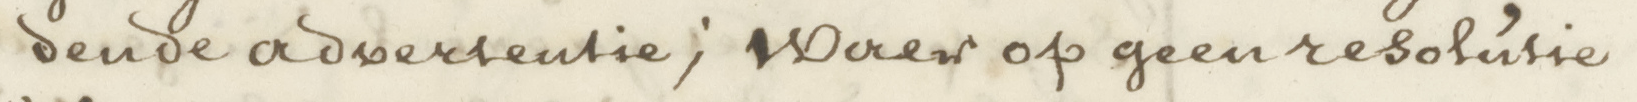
dende advertentie; Waer op geen resolutie
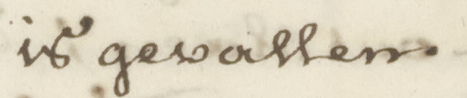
is gevallen.
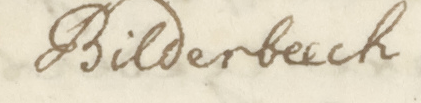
Bilderbeeck
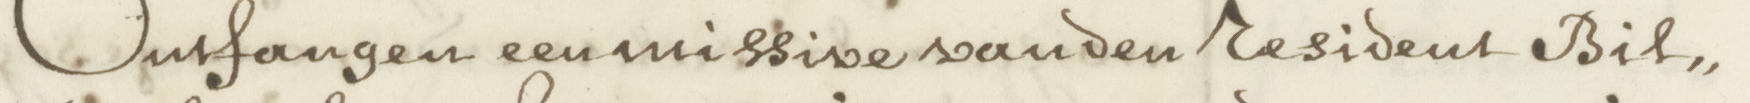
Ontfangen een missive vanden resident Bil„
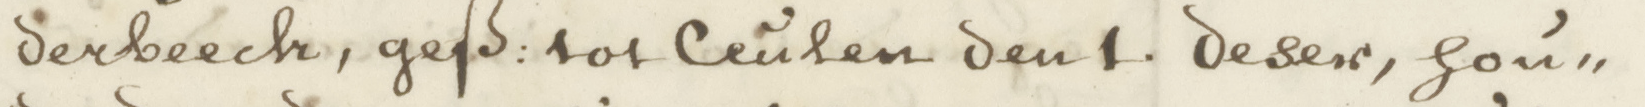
derbeeck, ges: tot Ceulen den 1. deser, hou„
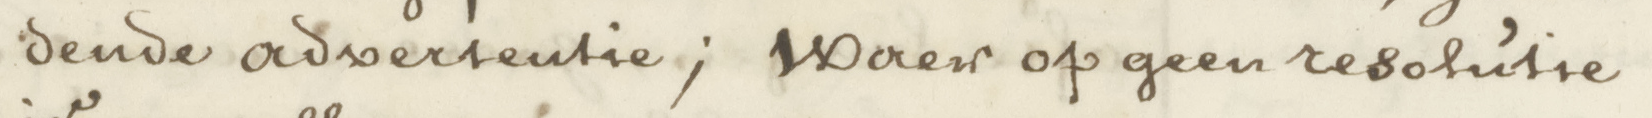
dende advertentie; Waer op geen resolutie
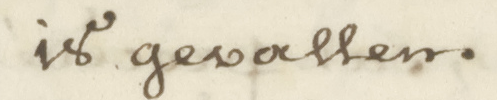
is gevallen.
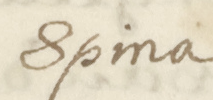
Spina
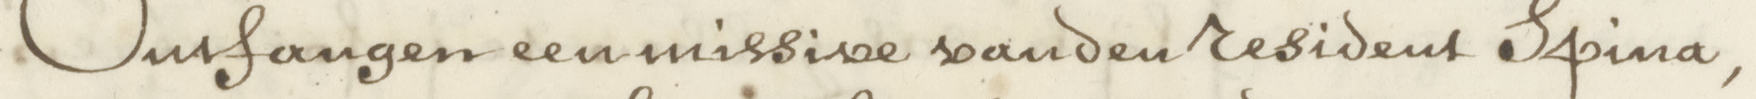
Ontfangen een missive vanden resident Spina,
